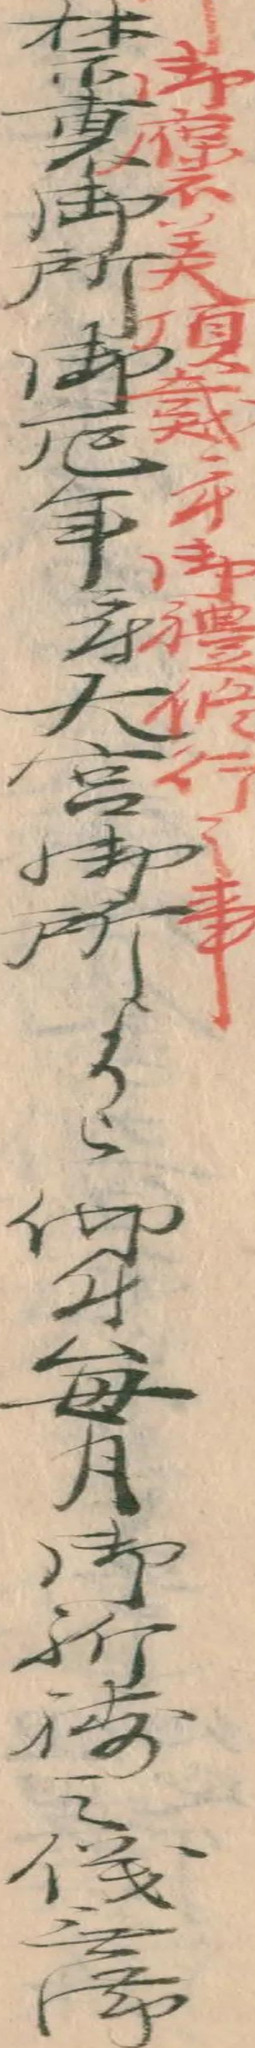禁裏御所御厄年ニ付大宮御所より被仰付毎月御祈祷之儀無滞
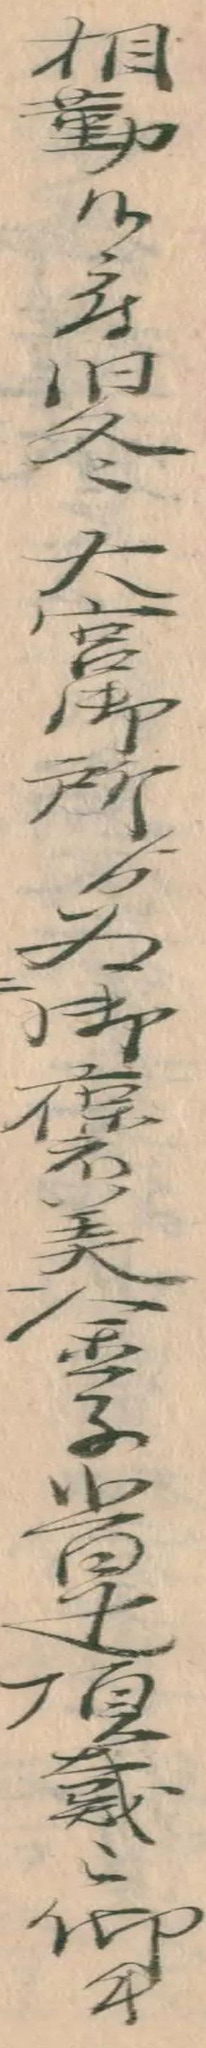相勤候ニ付旧冬大宮御所ゟ為御褒美金子弐百疋頂戴被仰付
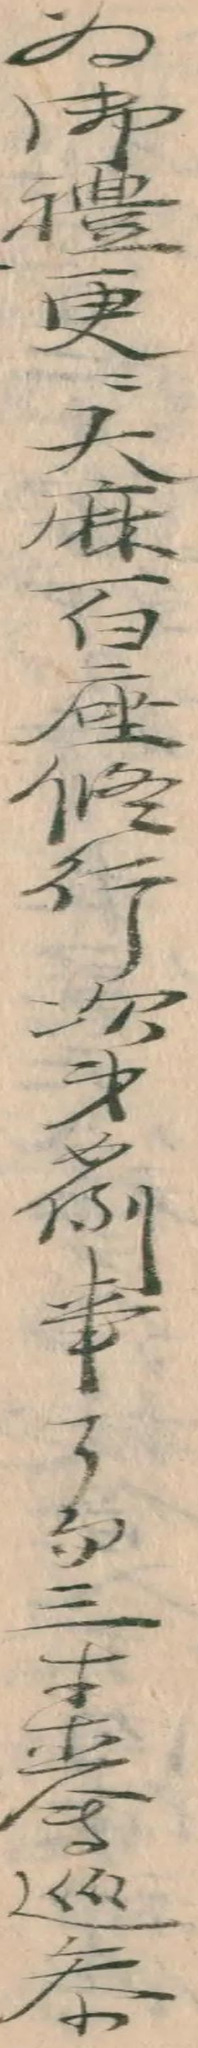為御禮更ニ大麻百座修行次第如例事了而三寸直會巡参
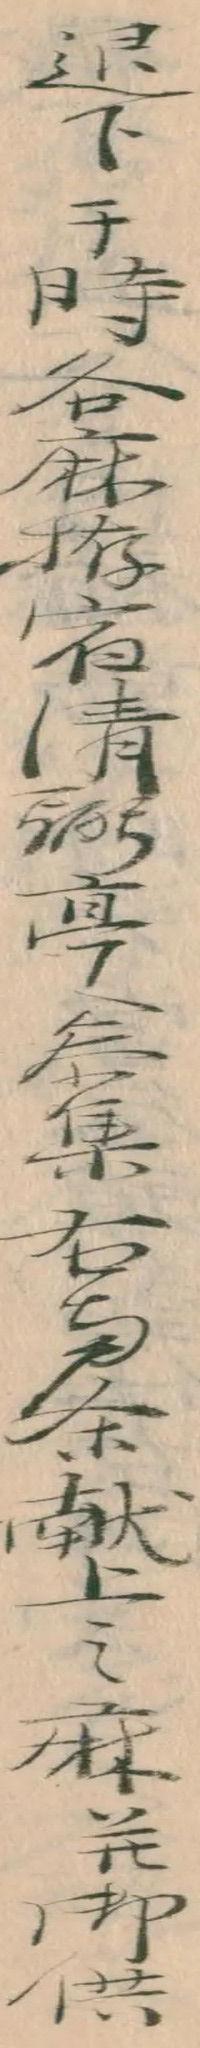退下于時各麻拵宿清弼亭へ参集右両余献上之麻幷御供
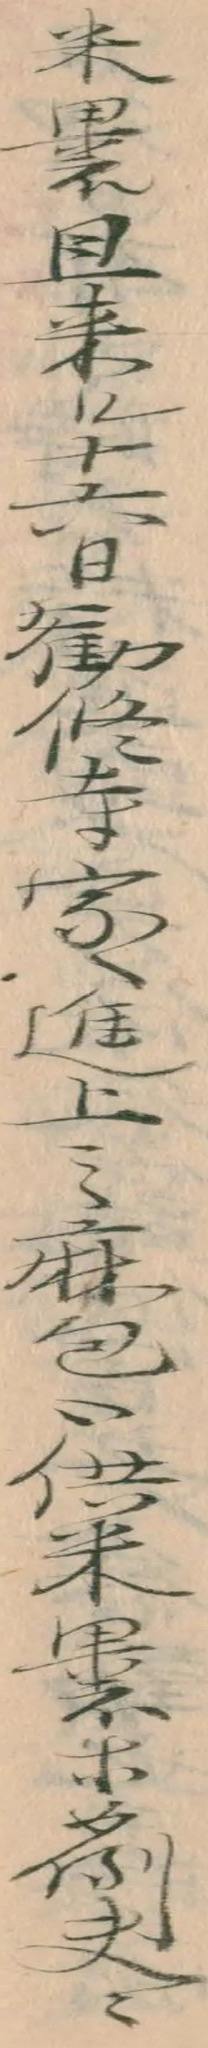米褁且来ル十六日勧修寺家へ進上之麻包御供米褁等如例夫々
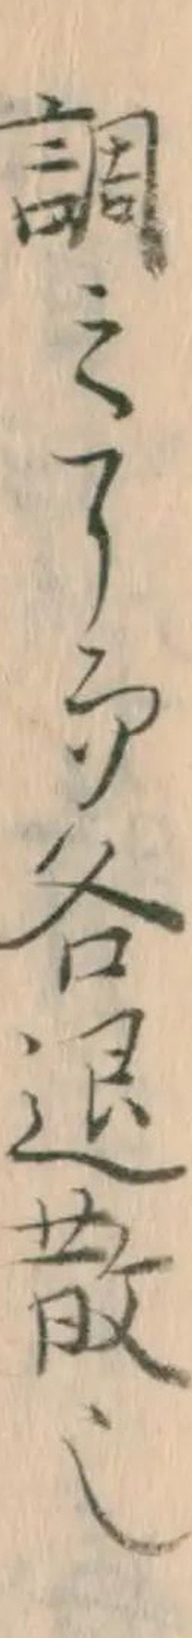調之了而各退散也
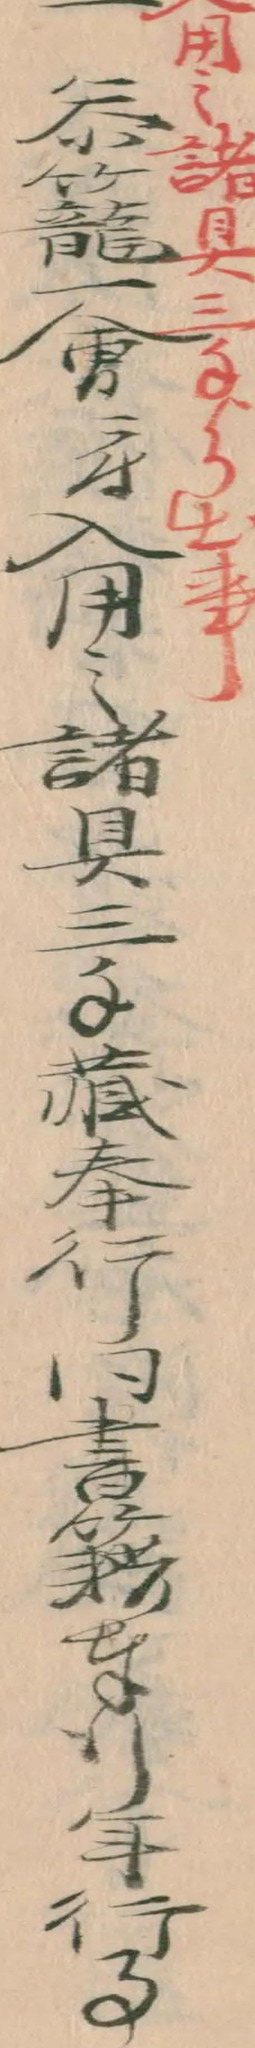一参籠一會ニ付入用之諸具三手蔵奉行同書籍奉行年行事
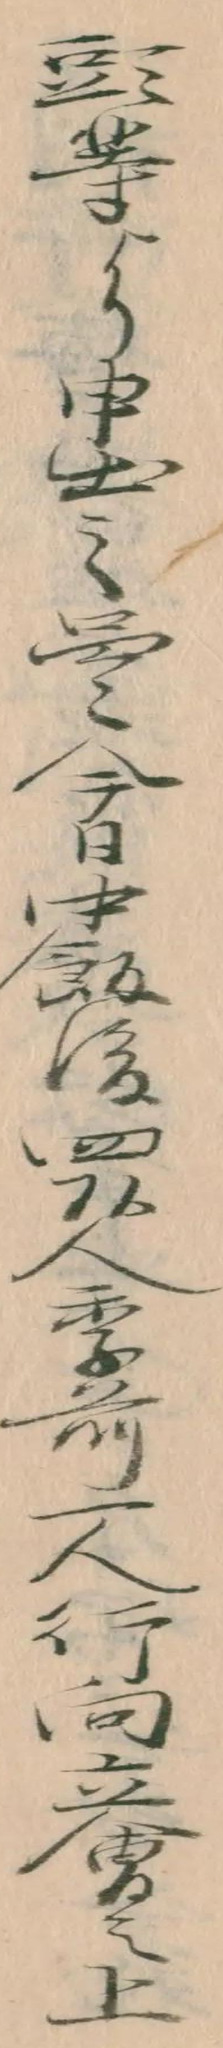頭等より申出之品々今日中飯後四頭人季前一人行向立會之上
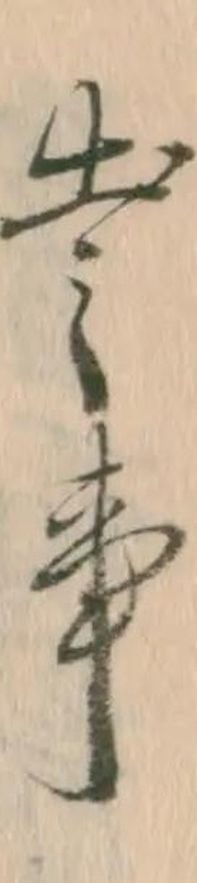出之事
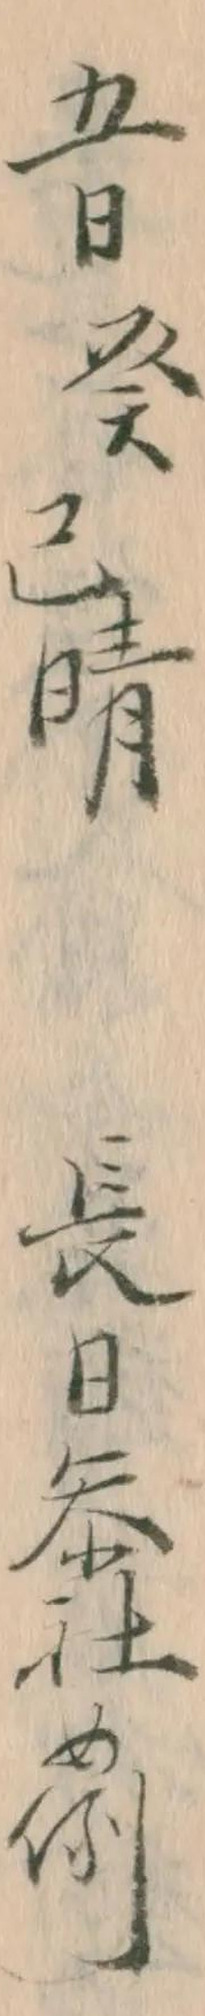五日癸巳晴長日参社如例
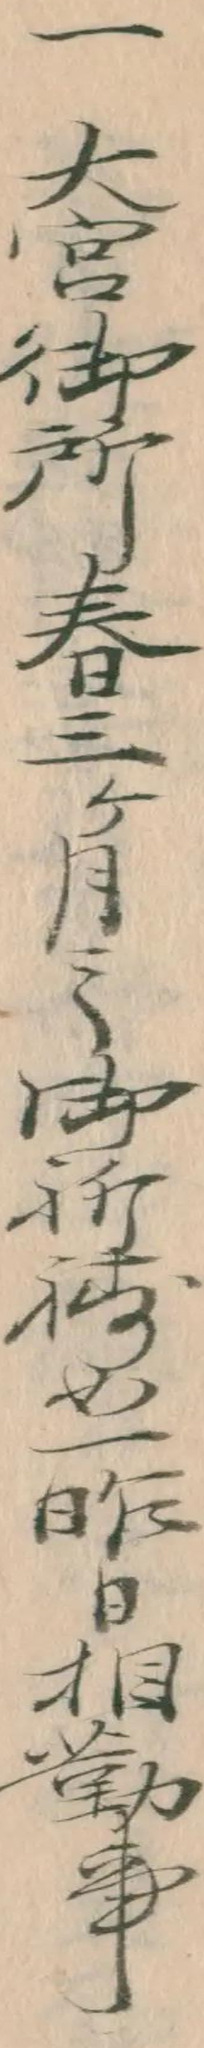一大宮御所春三ヶ月之御祈祷如一昨日相勤事
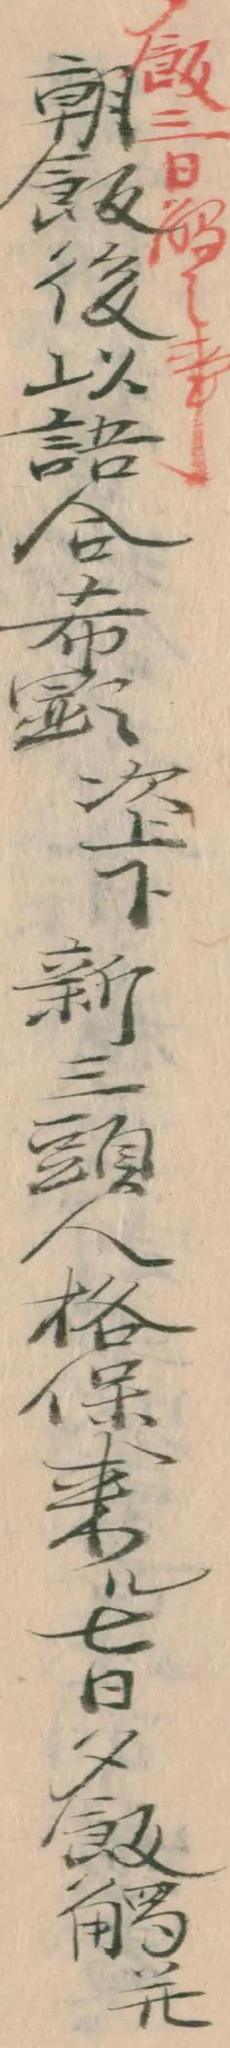一朝飯後以語合希顕次上下新三頭人格保来ル七日夕飯觸并
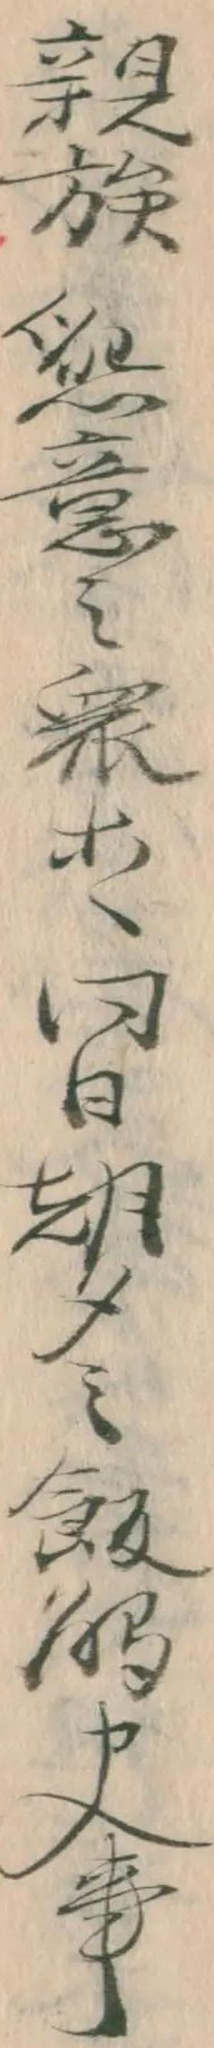親族懇意之衆等へ同日朝〆之飯觸申入事
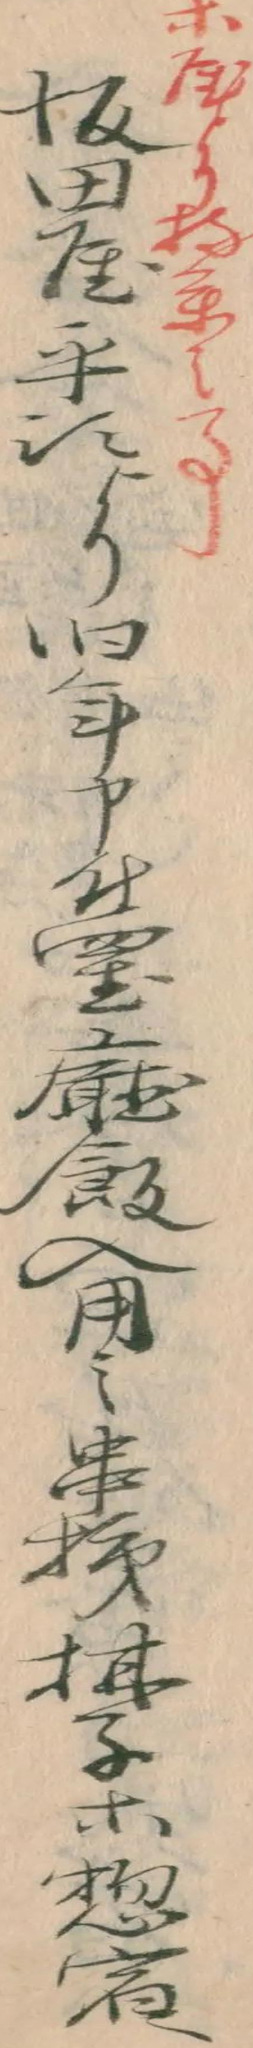一坂田屋平次より旧年申付置廳飯入用之串柿柑子等惣宿へ

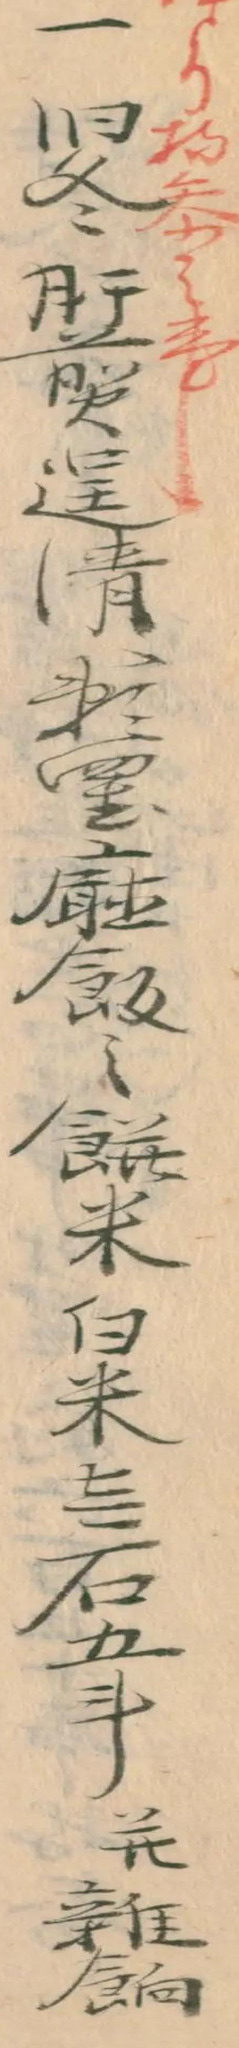一旧冬肝煎逞清頼置廳飯之餅米白米壱石五斗幷雑餉
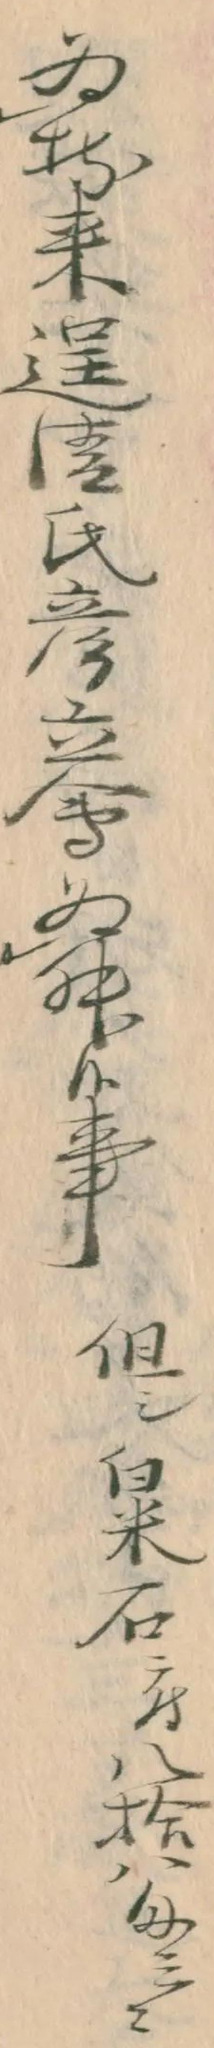為持来逞清氏彦立會為升候事但シ白米石ニ付八拾ハ匁云々
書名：賀茂社記録. 第74冊
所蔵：国立国会図書館 National Diet Library, JAPAN
